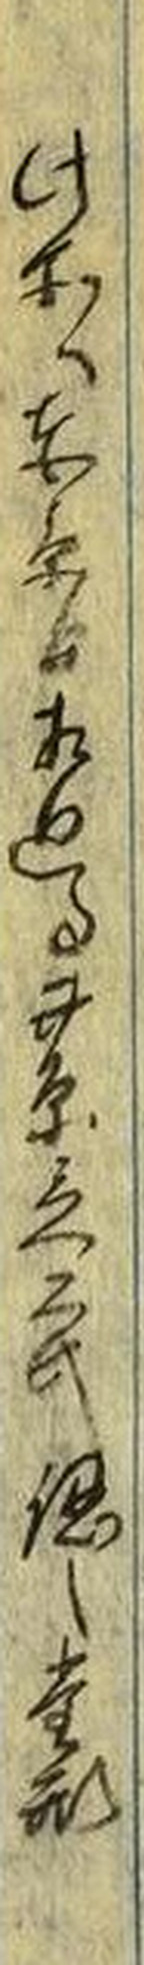此所へ東京ゟ相廻る井原立二氏認之堂形
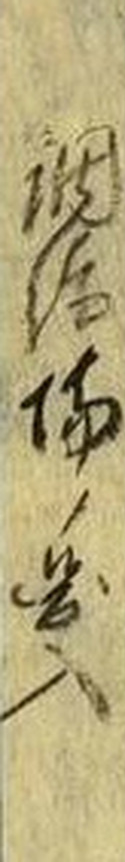調練場ノ図入
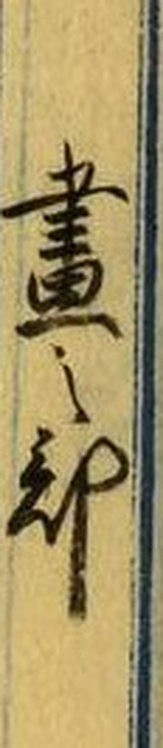画之部
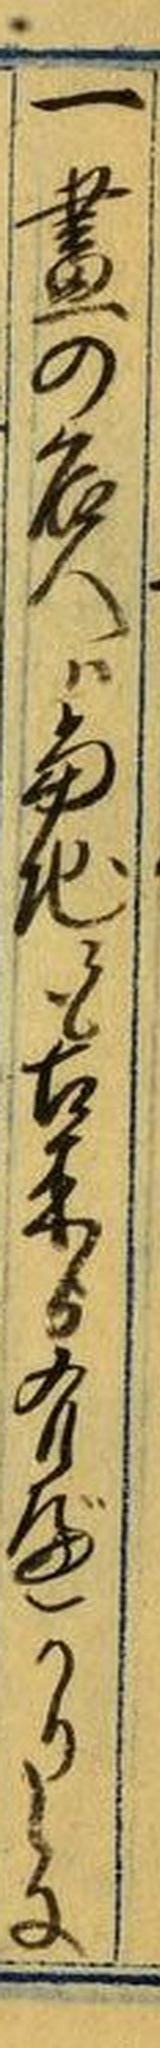一画の名人は当地にも古来ゟ有べかりしに
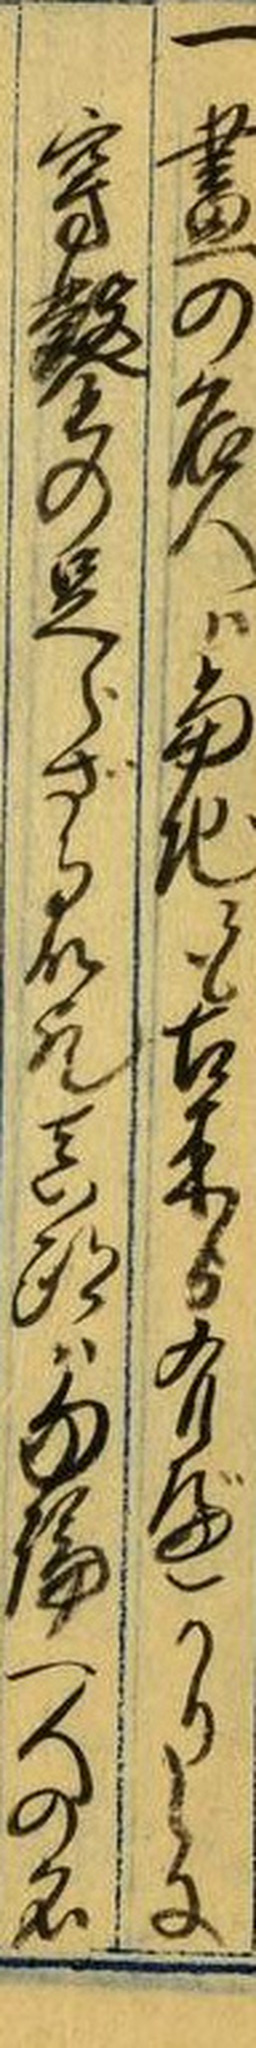穿鑿の足らざる故か真跡は勿論一人の名
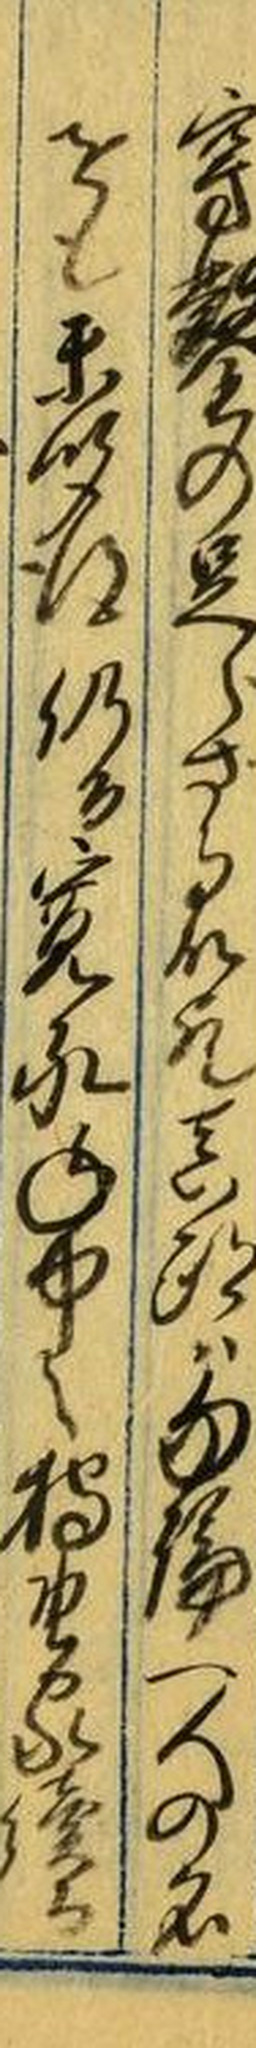をも未聞得仍而寛永年中之狩野家続而
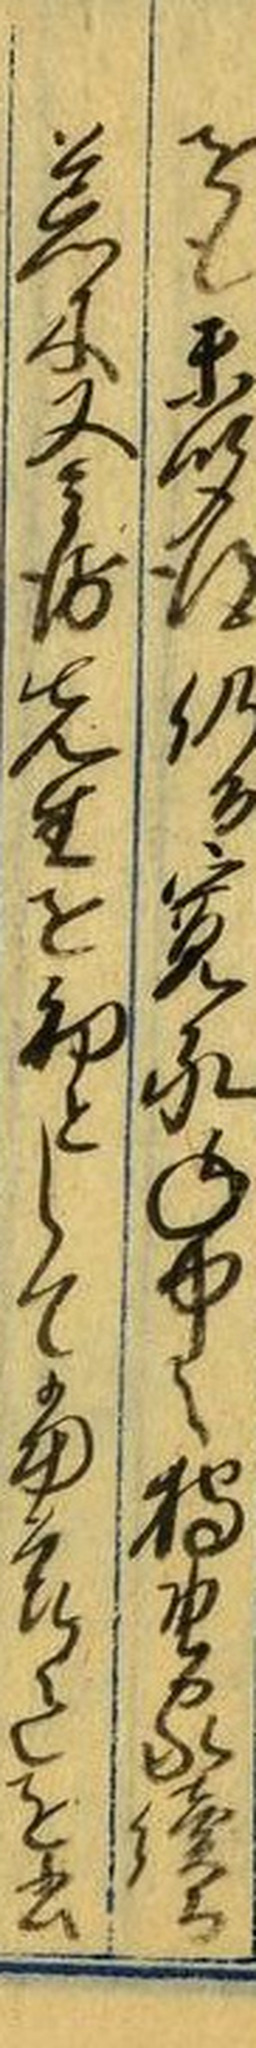荒木又兵衛先生を初として当節迄を書
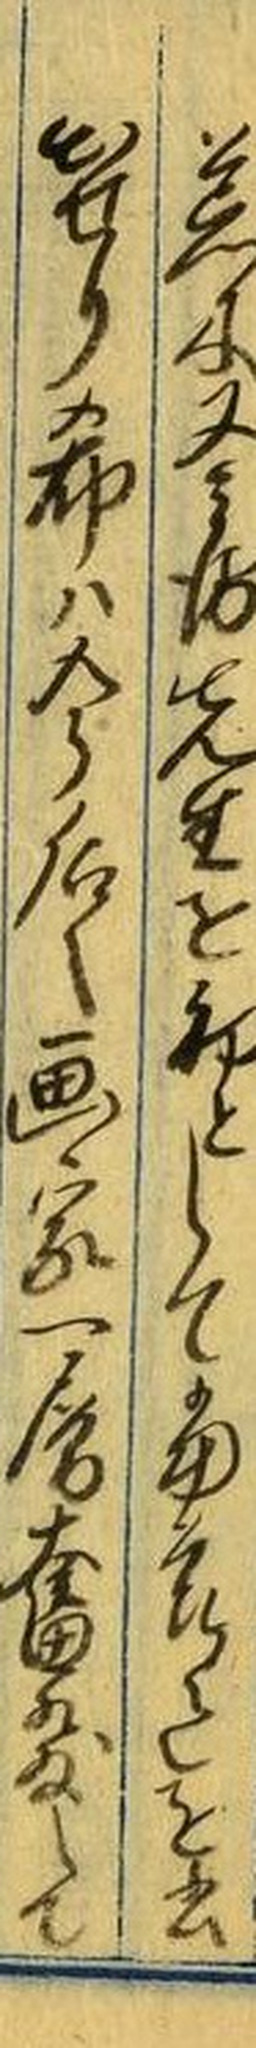出せり希は今后之画家一層奮発して
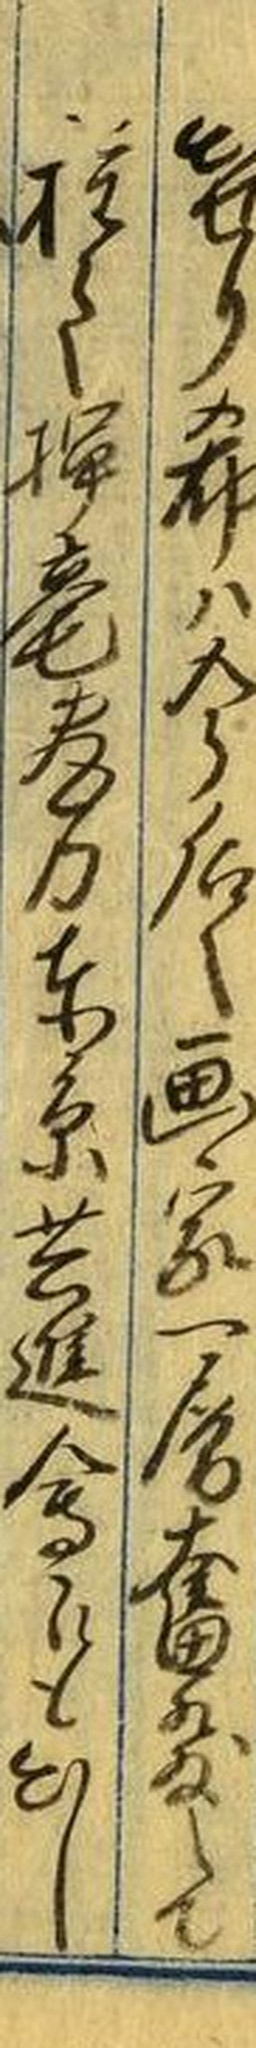種々之揮毫尽力東京芸進会えも出し
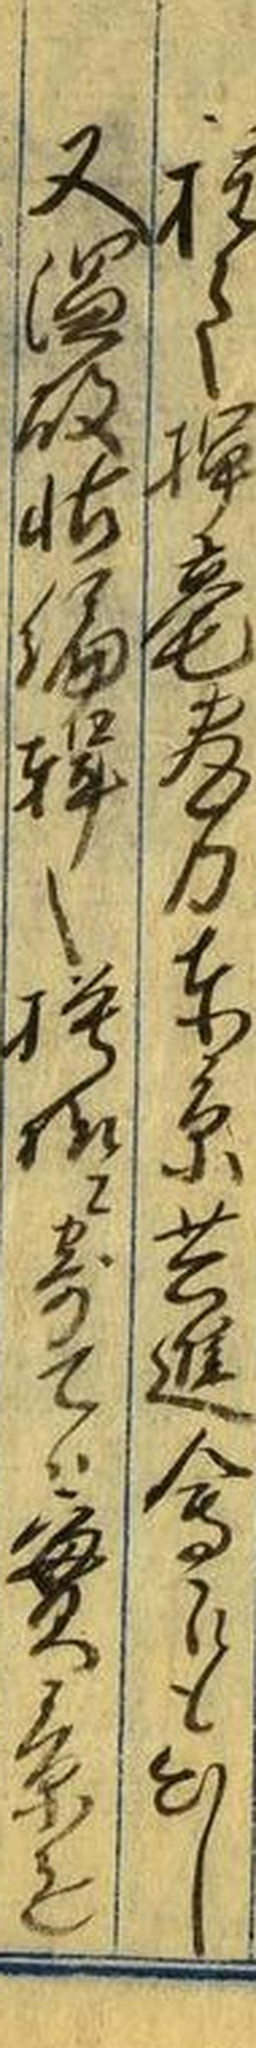又温故帖編輯之模様に寄ては実景を
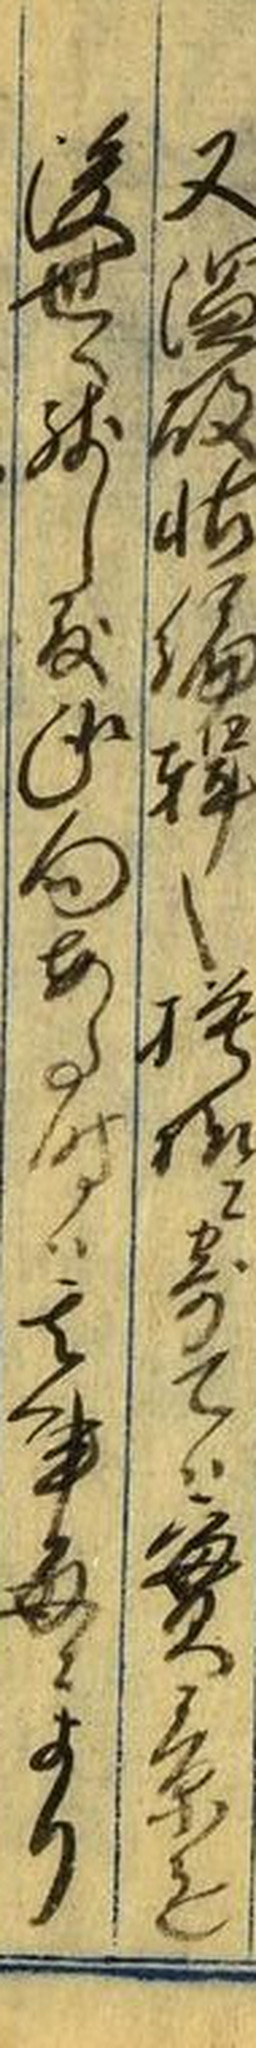後世へ残し度趣向ある時は其事毎により
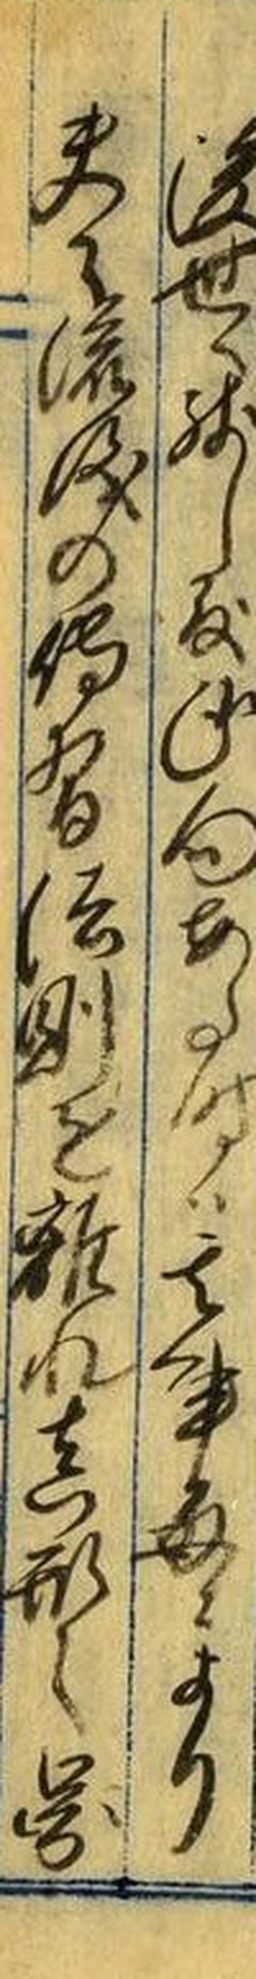夫々流儀の伝習法則を離れ真形之図

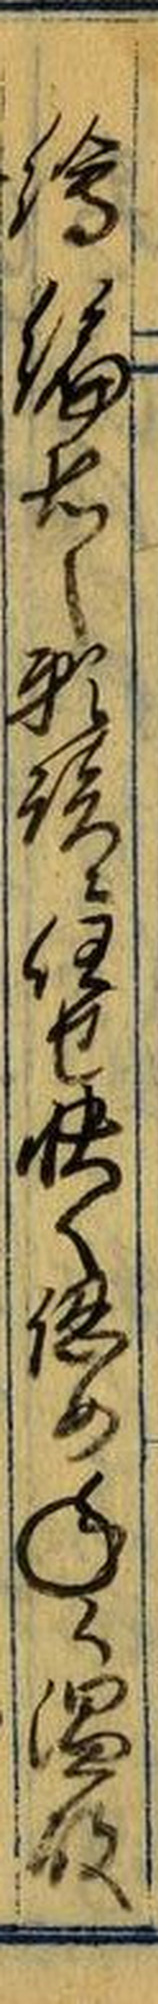絵編者之願談に任せ快く認め年々温故
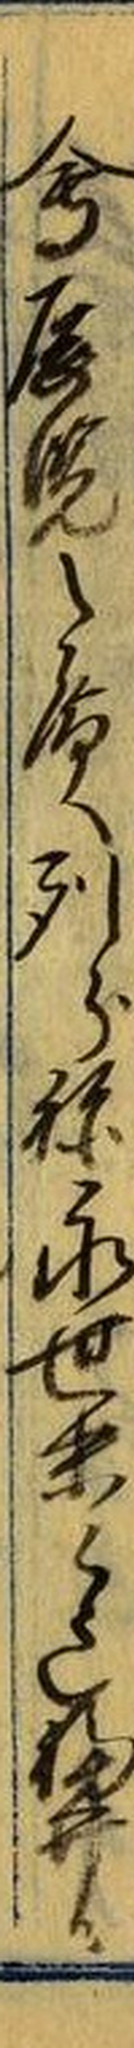会展覧之広く列らね永世末々迄福井之
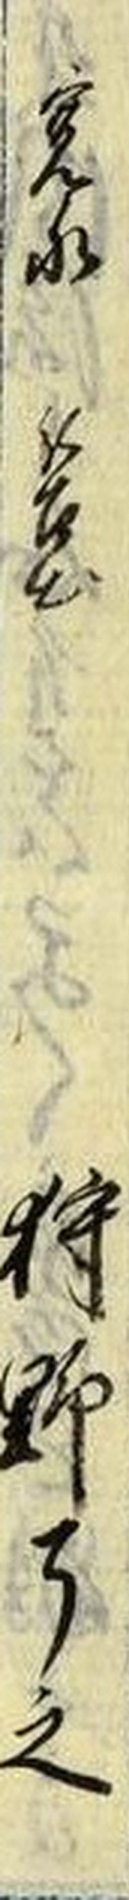寛永被召出狩野了之
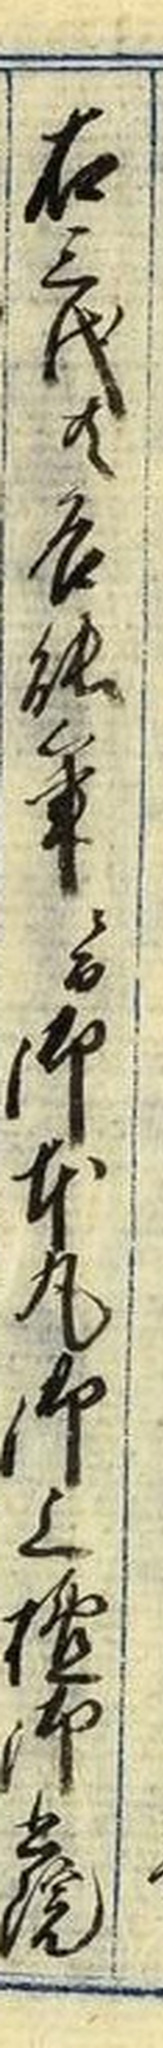右三代共各能筆に而御本丸御上檀御書院
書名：温古集 四巻
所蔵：福井県文書館 Fukui Prefectural Archives
